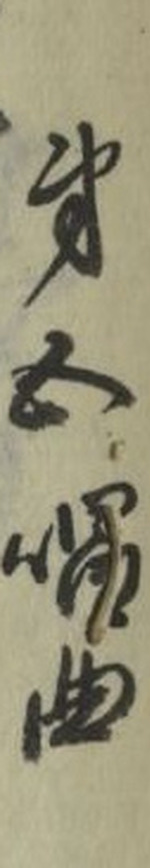第五唱曲
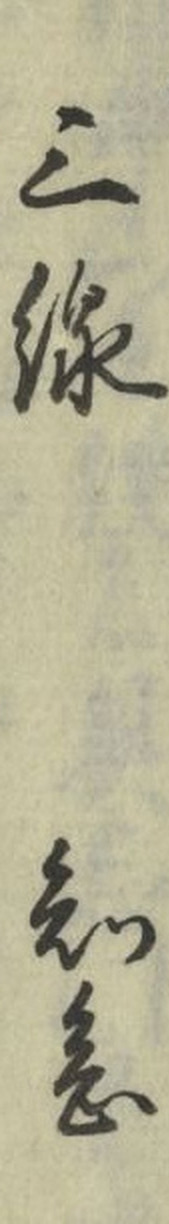三線知念
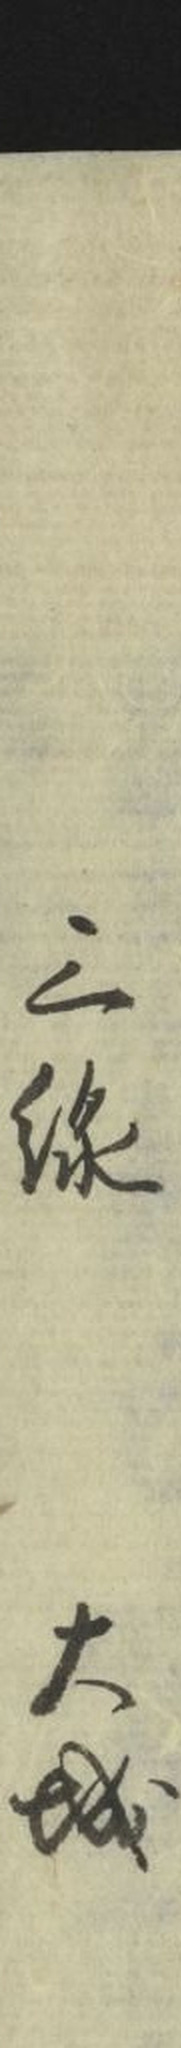三線大城
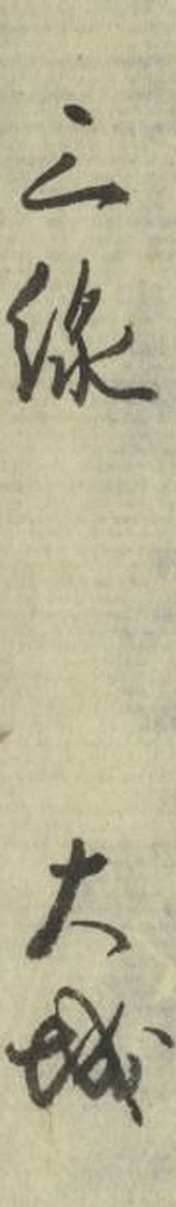三線大城
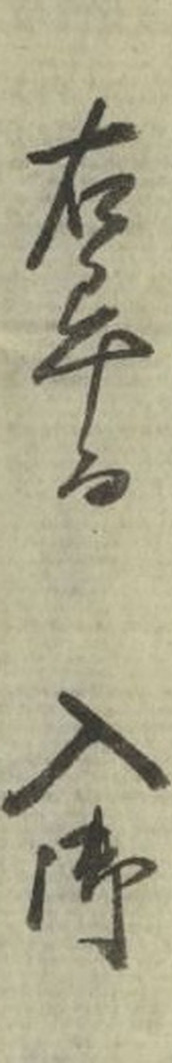右畢て入御

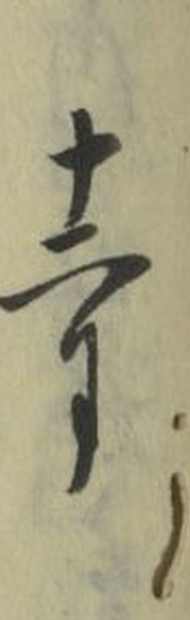十二月
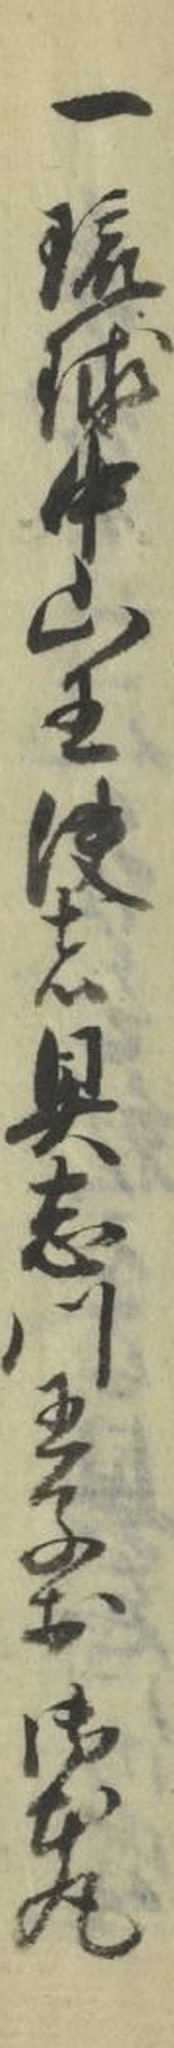一琉球中山王使者具志川王子於御本丸
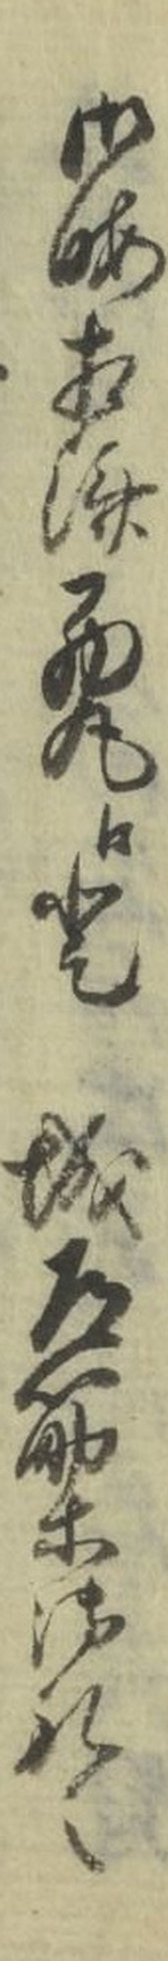御暇相済西丸え登城道筋等御礼之
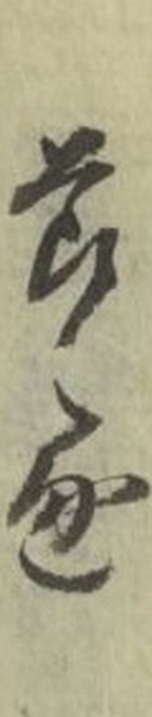節之通
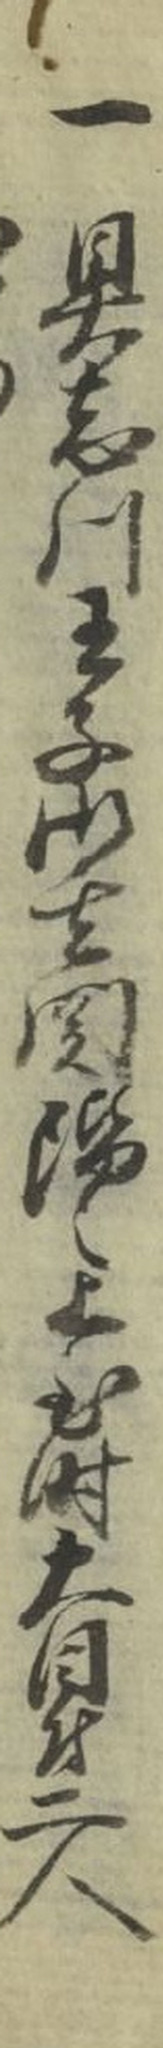一具志川王子御玄関階之上至時大目付二人
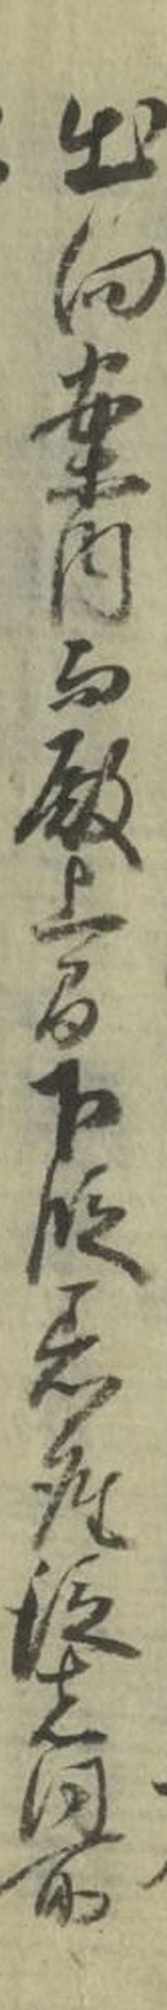出向案内而殿上間下段着座従者同所
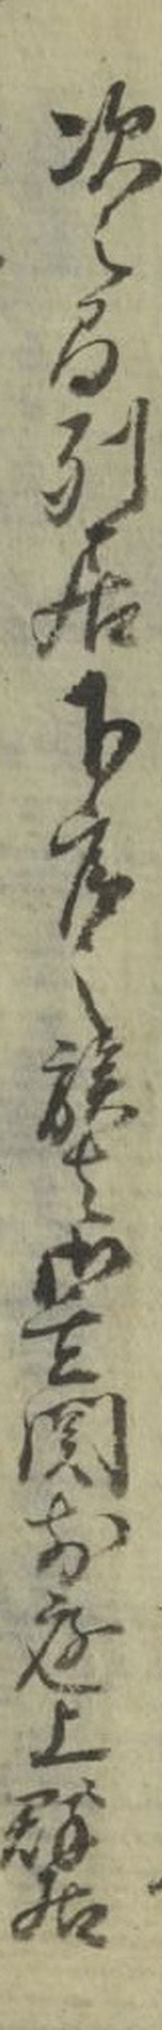次之間列居下官之族は御玄関前庭上群居
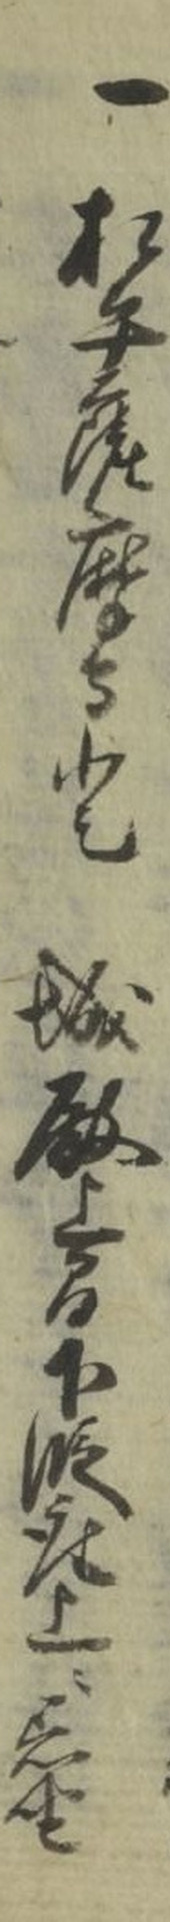一松平薩摩守登城殿上間下段座上に着座

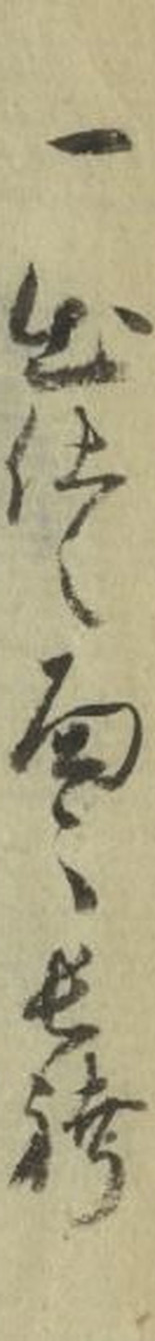一出仕之面々長袴
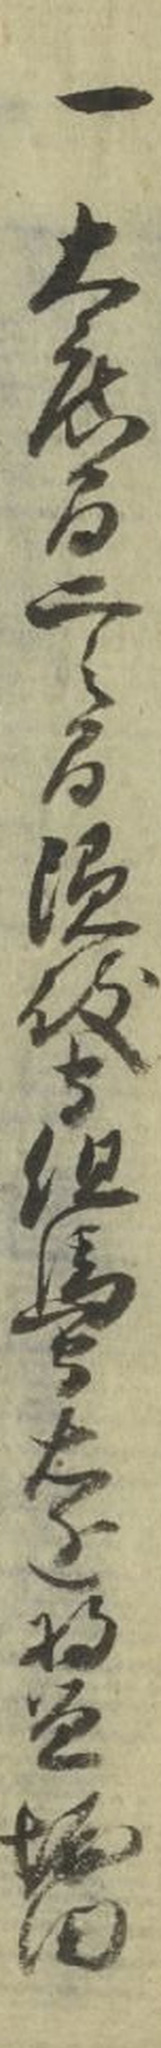一大広間二之間隠岐守但馬守右近将監堀田
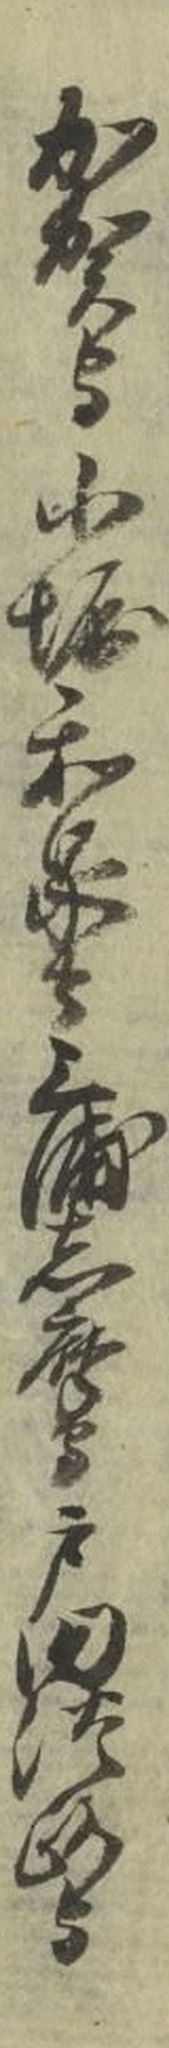加賀守小堀和泉守三浦志摩守戸田淡路守
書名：戊辰琉球人来朝之式 全
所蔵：University of the Ryukyus Library
